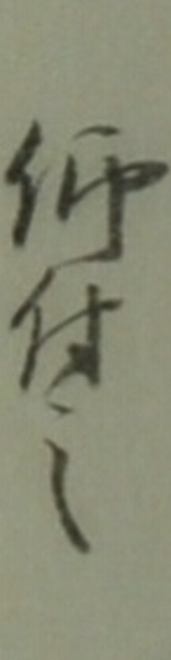仰付之
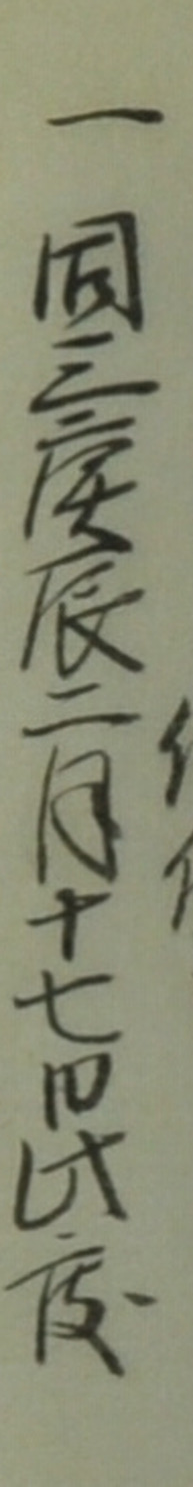一同三庚辰二月十七日此度

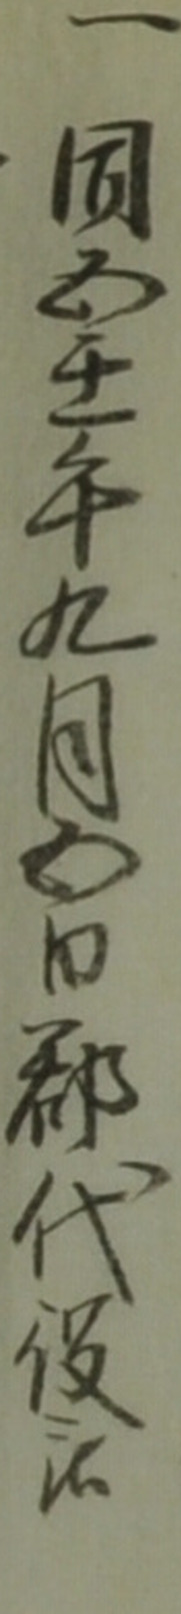一同五壬午九月五日郡代役被
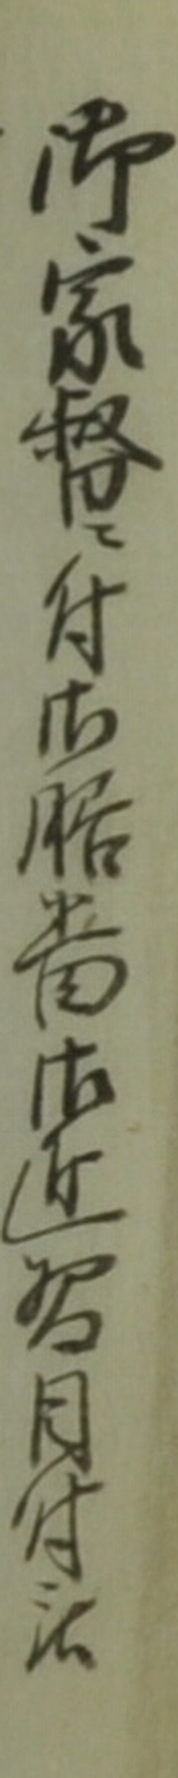御家督ニ付御膳番御近習目付被
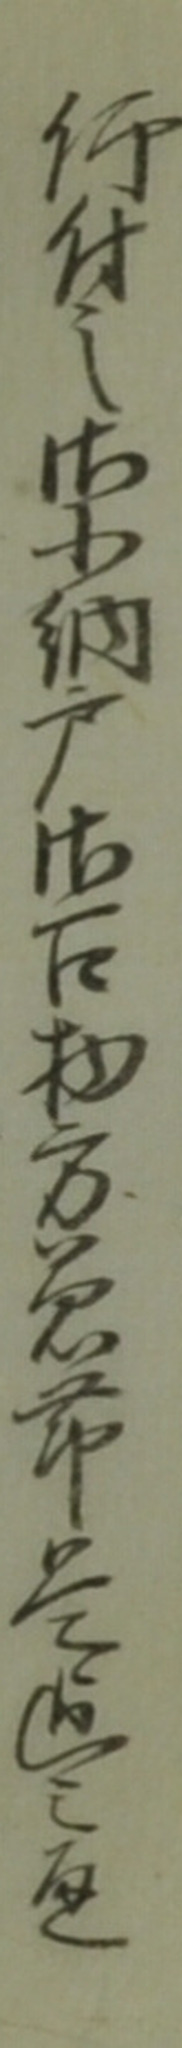仰付之御小納戸御召物方兼帯是迄之通
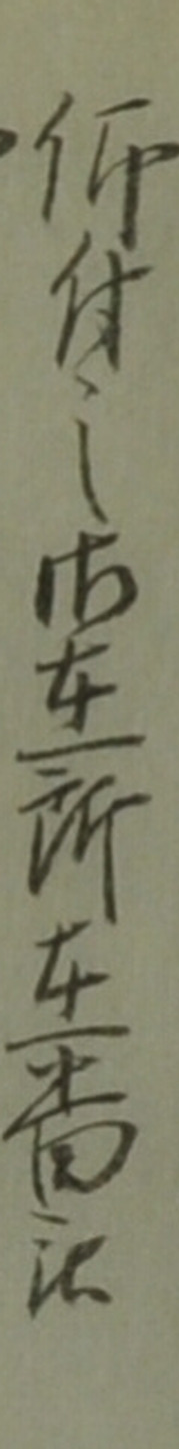仰付之御在所在番被
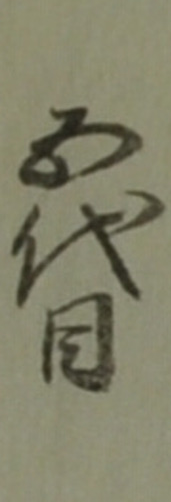五代目
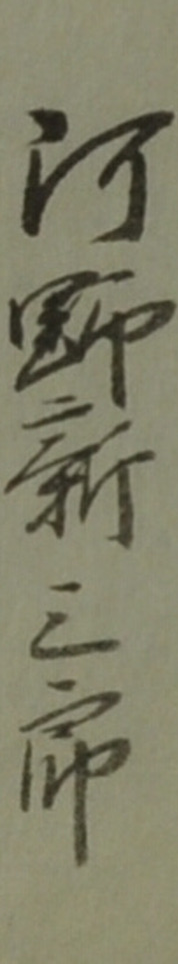河野新三郎
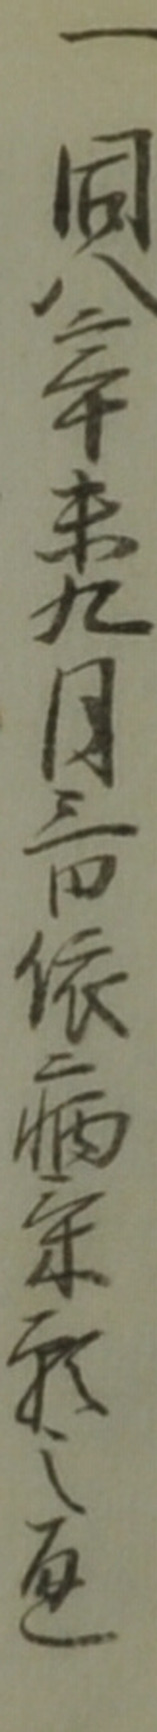一同八辛未九月三日依病気願之通
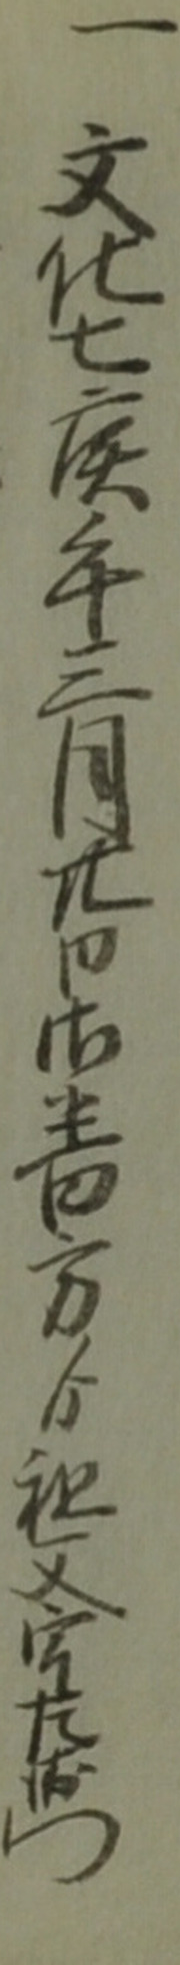一文化七庚三月廿日御番方ゟ祖父宇左衛門
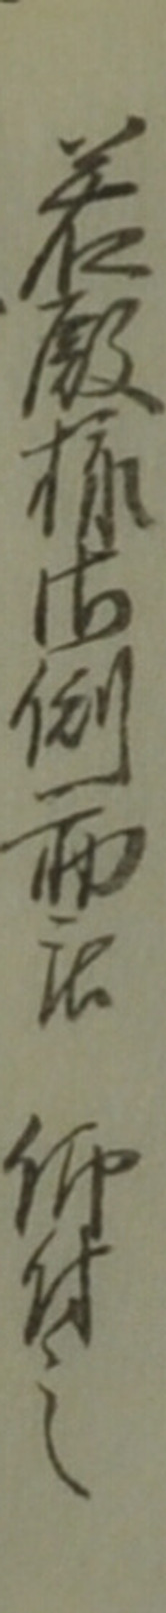若殿様御側勤被仰付之
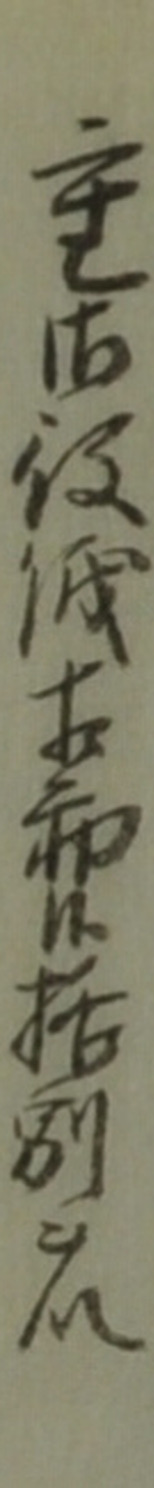重御役儀相勤候格別ヲ以
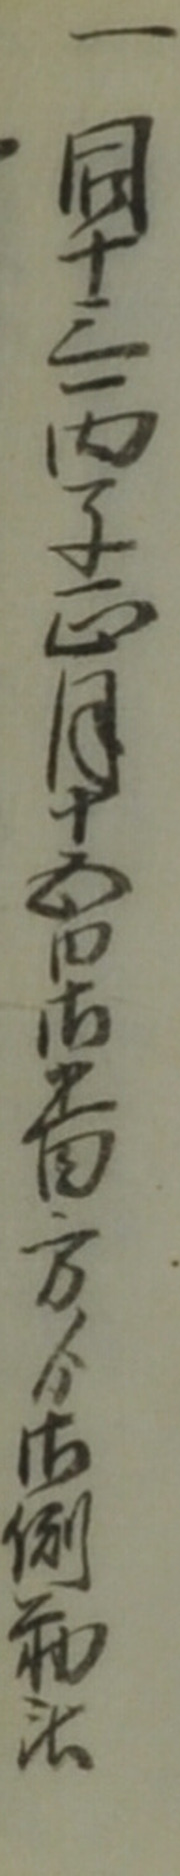一同十三丙子正月十五日御番方ゟ御側勤被
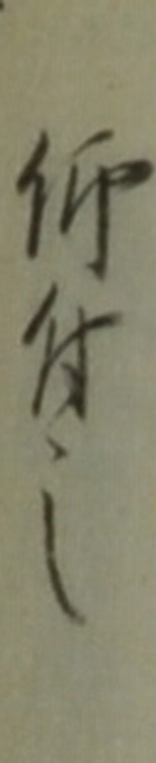仰付之
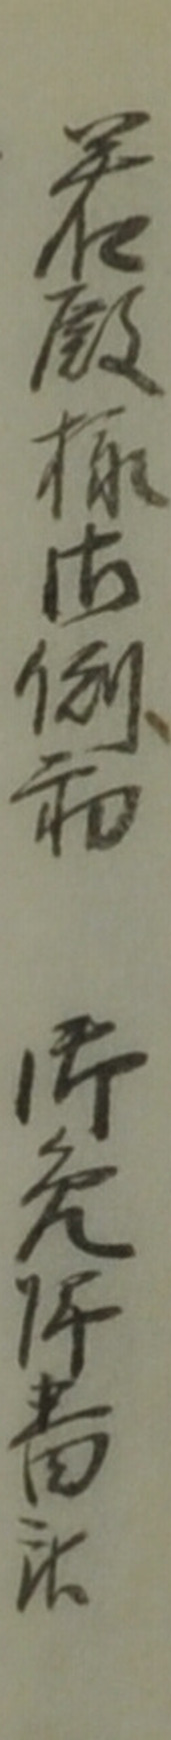若殿様御側勤御免帰番被
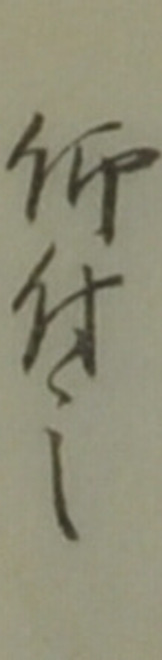仰付之
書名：諸御役代々録（五）
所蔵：伊那市立高遠町図書館・合同会社AMANE
